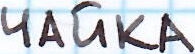чайка
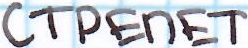стрепет
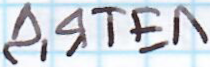дятел
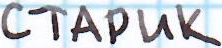старик
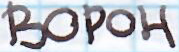ворон
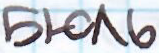бюль
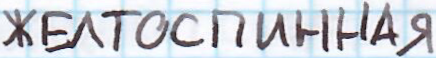желтоспинная
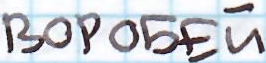воробей
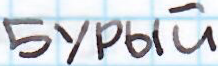бурый
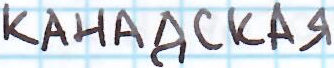канадская
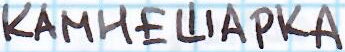камнешарка
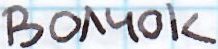волчок
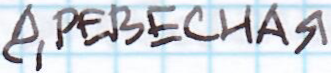древесная
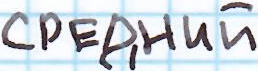средний
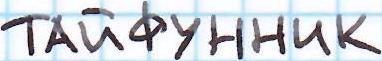тайфунник
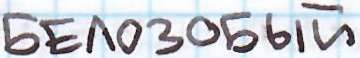белозобый
